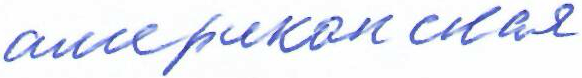американ ская
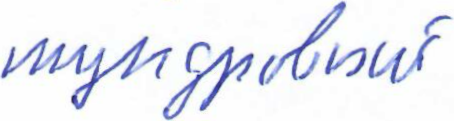тундровый
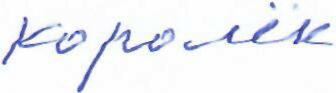королёк
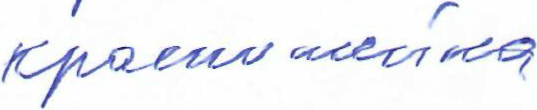красно шейка
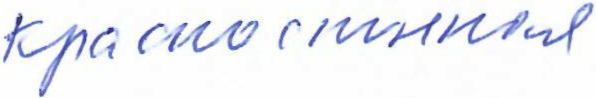красноспинная
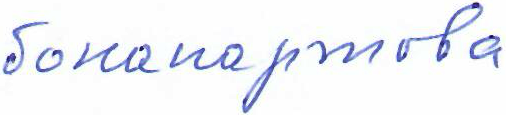бонапартова
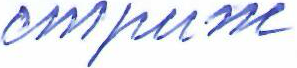стриж
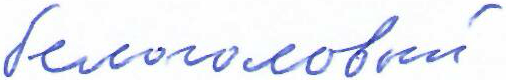белоголовый
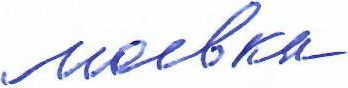моевка
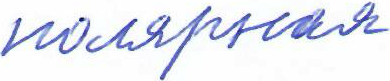полярная
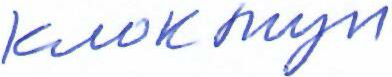клоктун
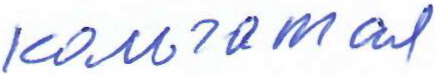кольчатая
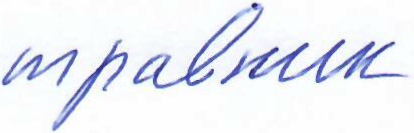травник
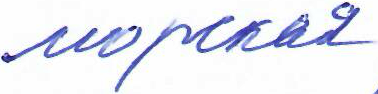морская
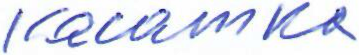касатка
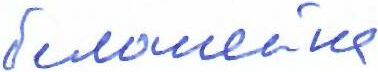белошейка
